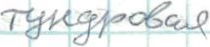тундровая
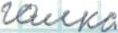галка
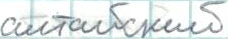алтайский
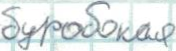буробокая
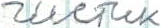чистик
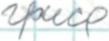грисе
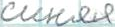синяя
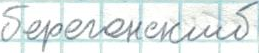берегенский
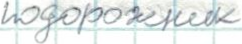подорожник
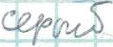серый
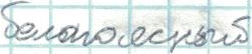белопоясный
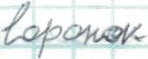воронок
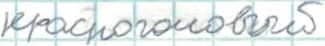красноголовый
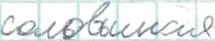соловьиная
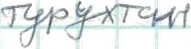турухтан
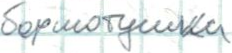бормотушка
